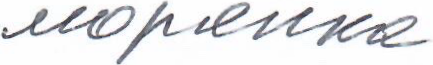морянка
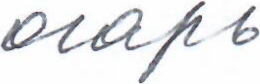огарь
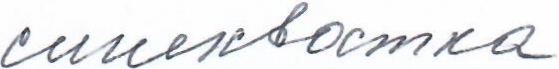синехвостка
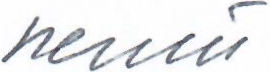пегий
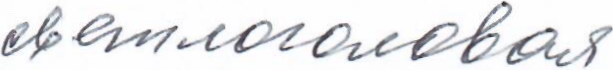светлоголовая
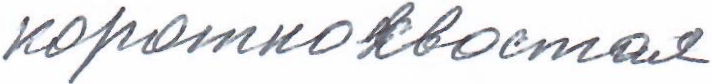короткохвостая
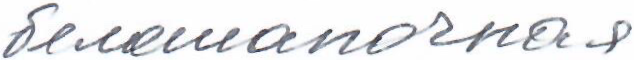белошапочная
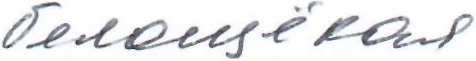белощёкая
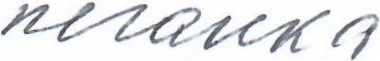пеганка
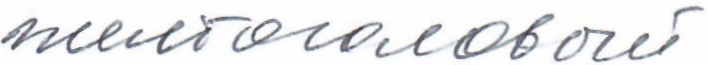желтоголовый
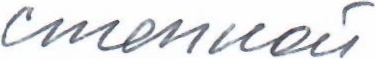степной
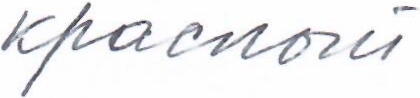красный
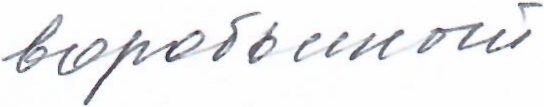воробьиный
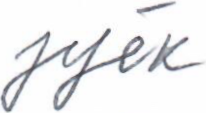зуёк
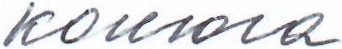конюга
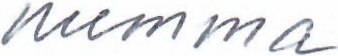питта
